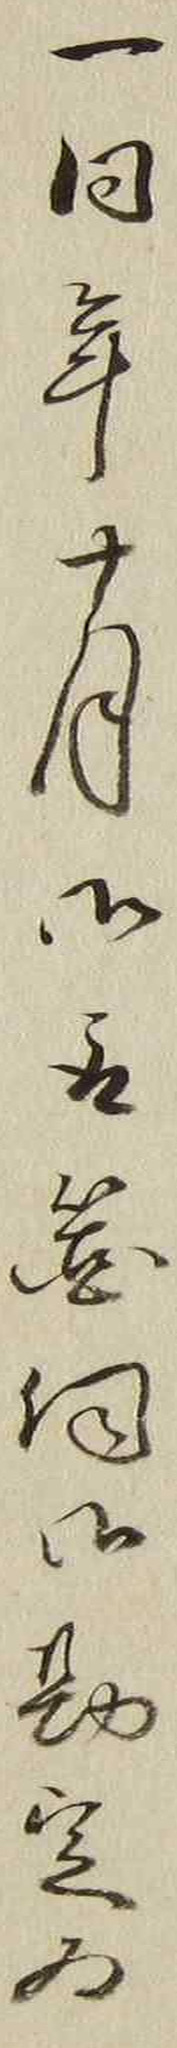一同年十月御取箇伺御勘定為
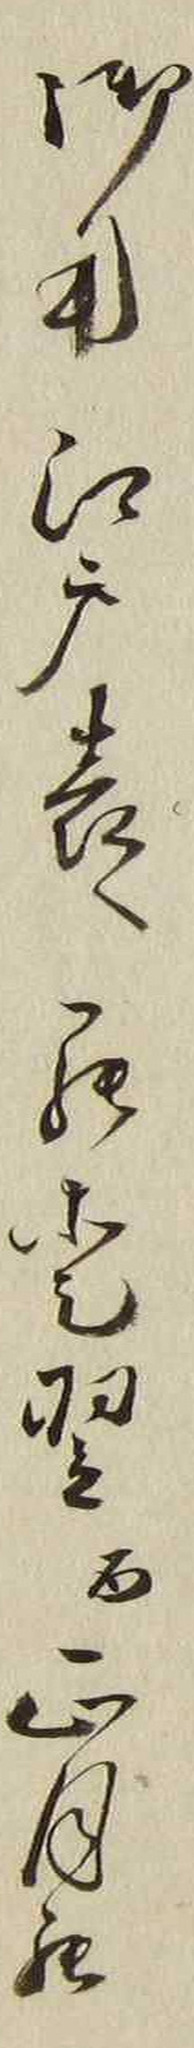御用江戸表へ罷登翌酉正月罷

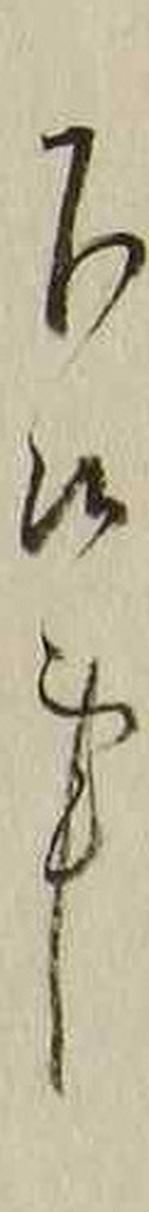下候事
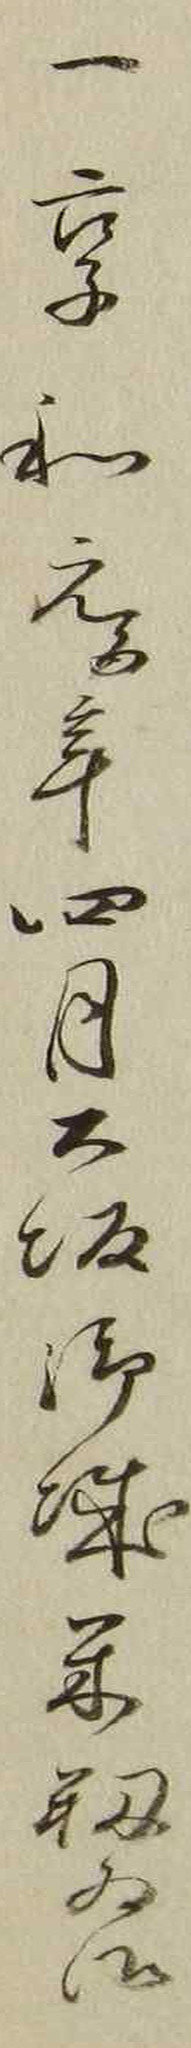一享和元酉年四月大坂御城米籾為御
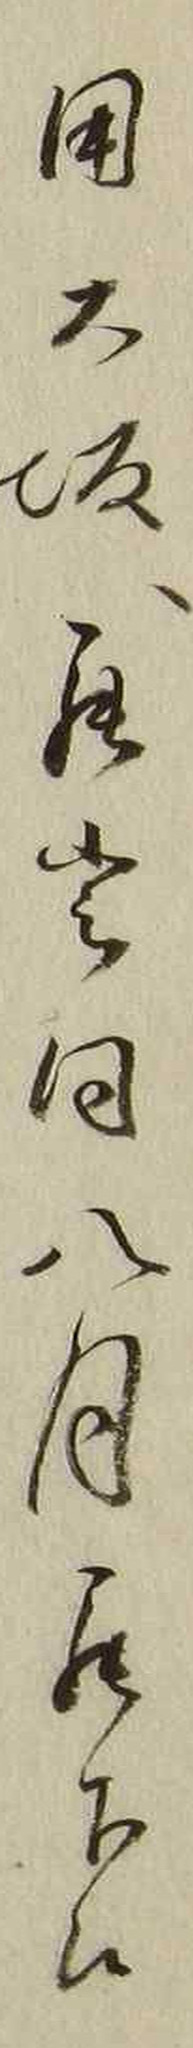用大坂へ罷登同八月罷下候
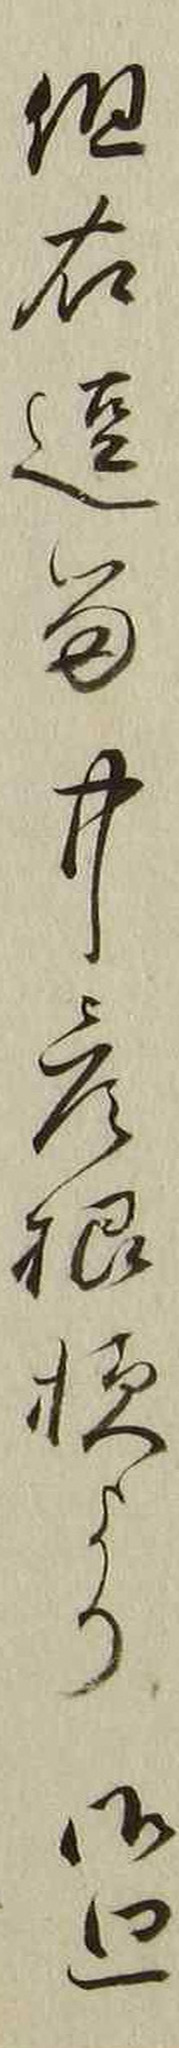但右逗留中彦根様より御廻
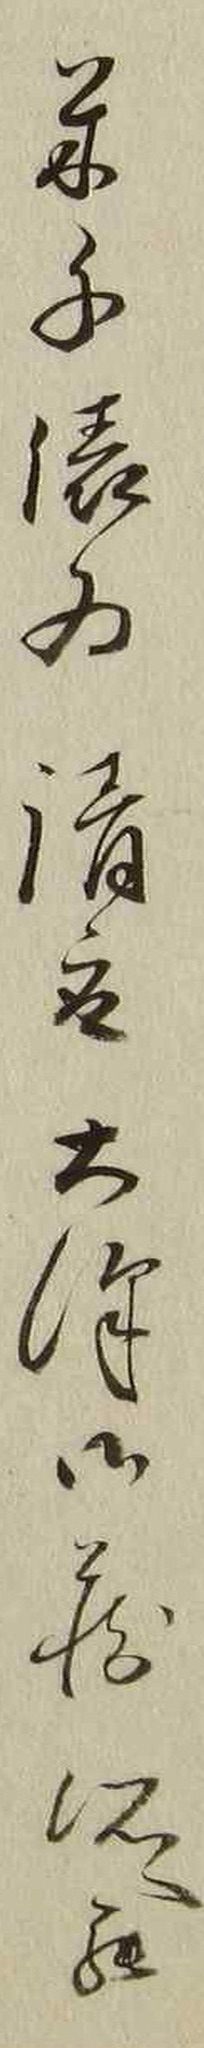米千俵為請取大津御蔵所へ罷
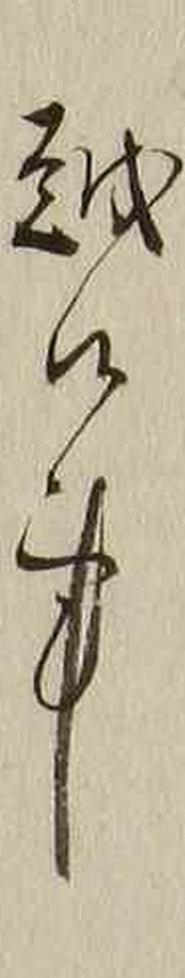越候事
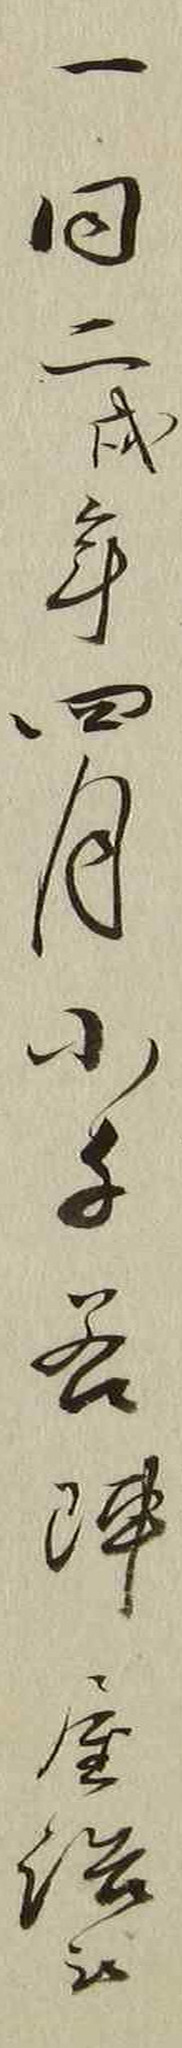一同二戌年四月小千谷陣屋詰被
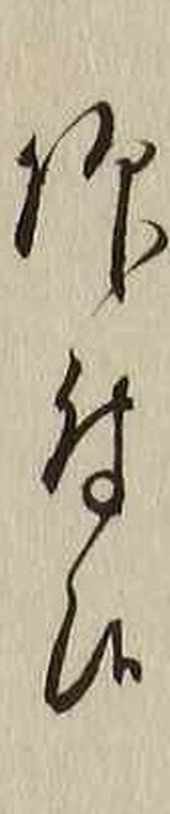仰付候
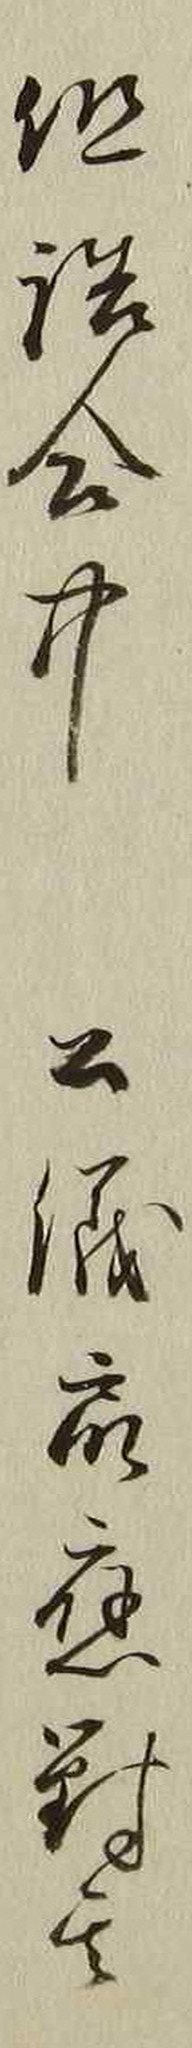但詰合中公儀衆応対其
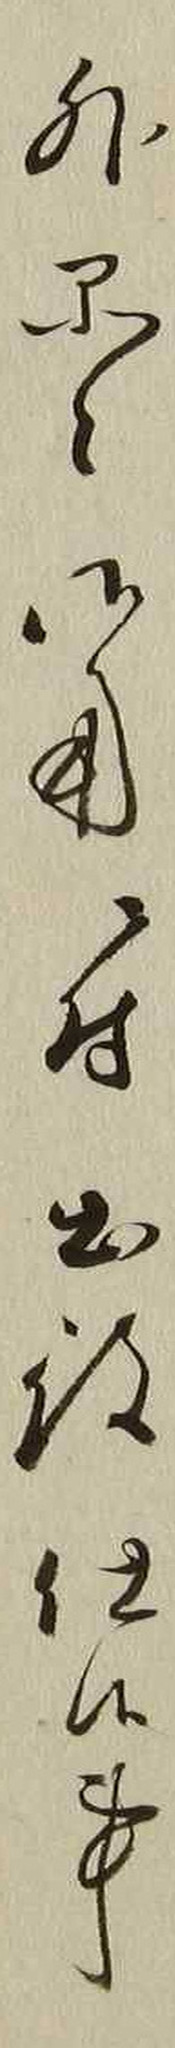外品々御用ニ付出役仕候事
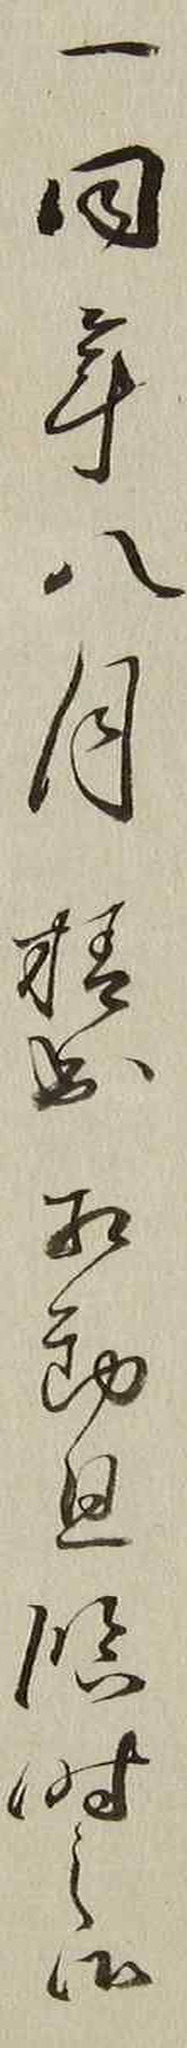一同年八月精出相勤且臨時之御
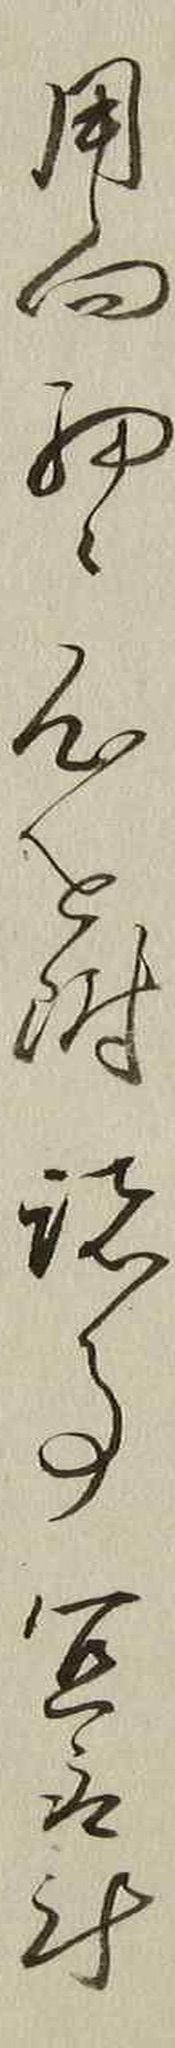用向細々心を附諸事宜取計
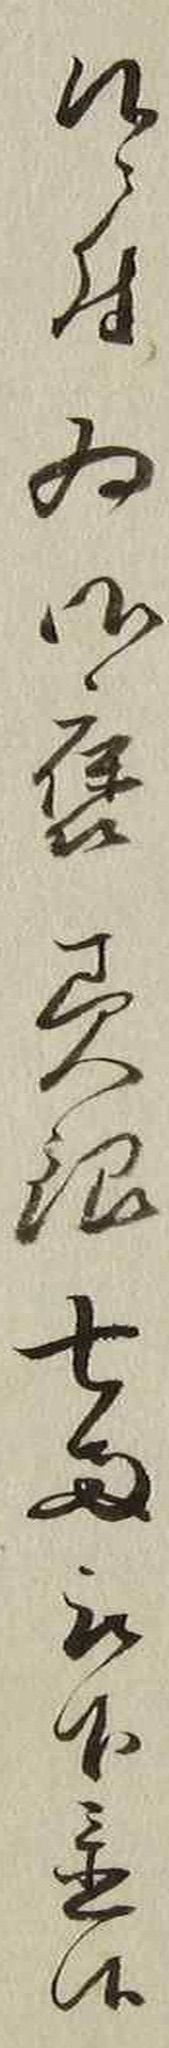候ニ付為御褒美銀七両被下置候
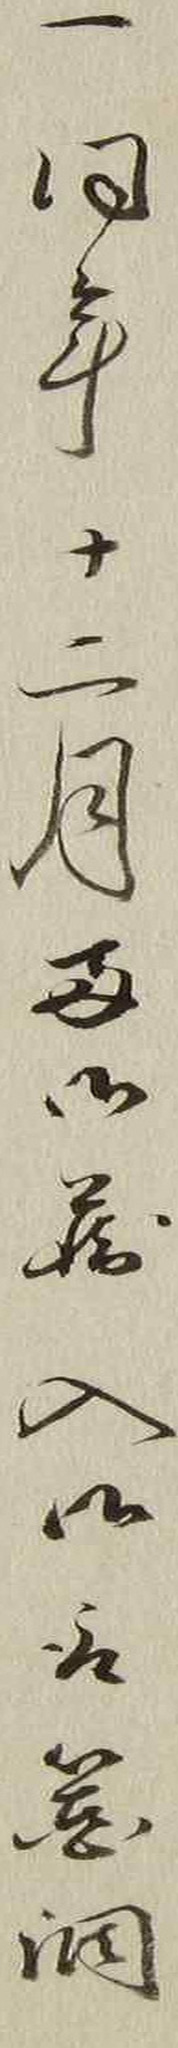一同年十二月当御蔵入御取箇調
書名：諸士系譜　巻之52　に之部3
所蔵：会津若松市立会津図書館
